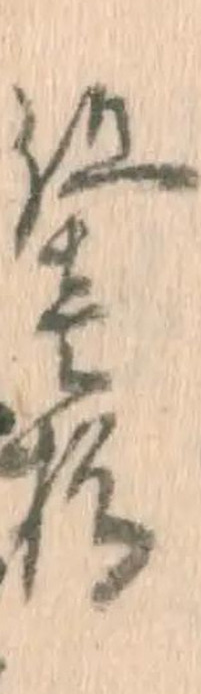但壱樽
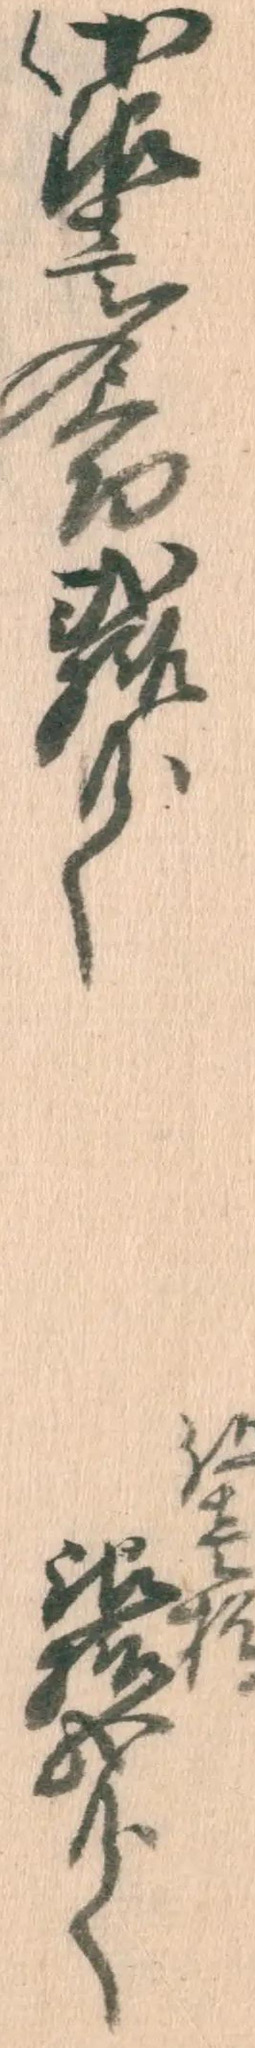代銀壱〆三百弐拾匁銀拾弐匁
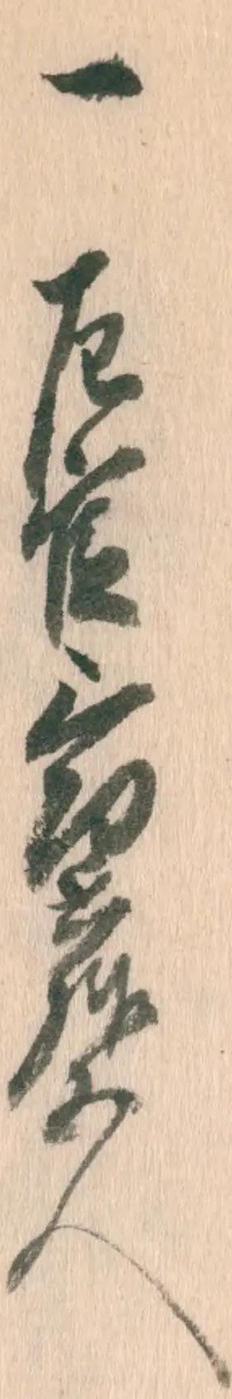一左官三百六拾五人
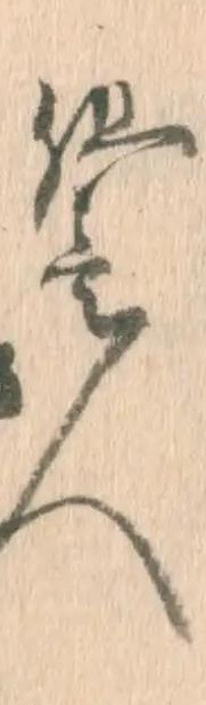但壱人
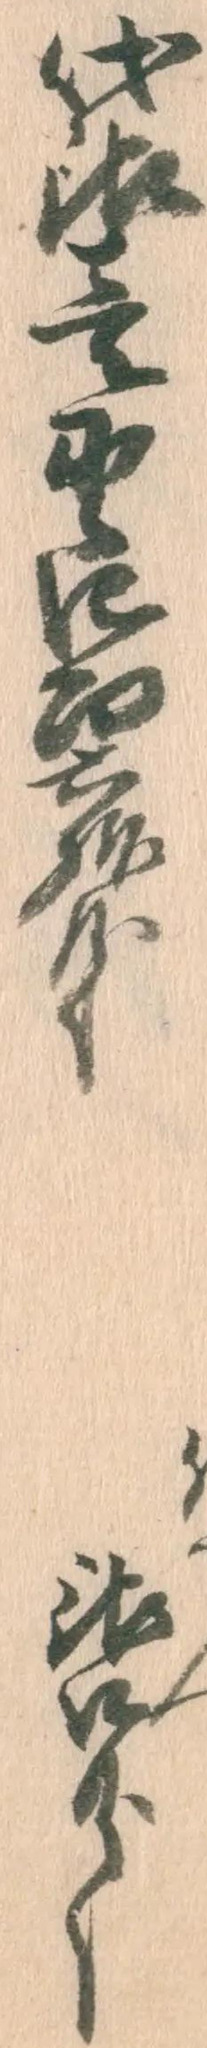代銀壱貫四百六拾匁銀四匁

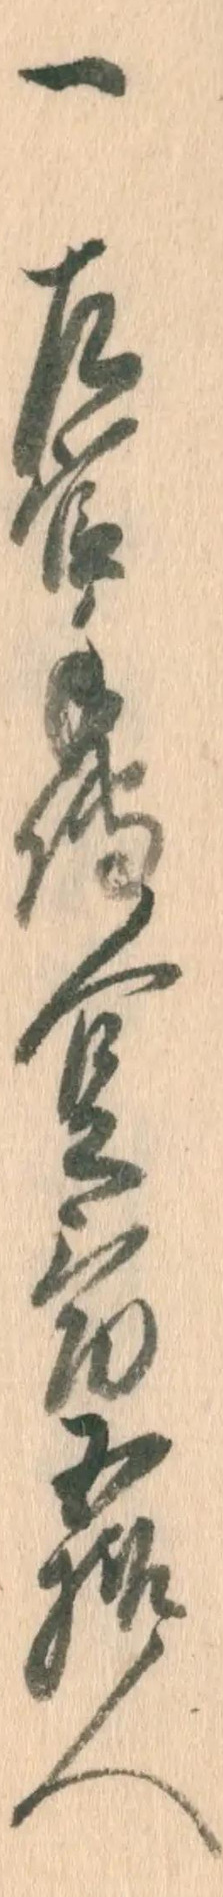一左官手伝人足三百五拾人
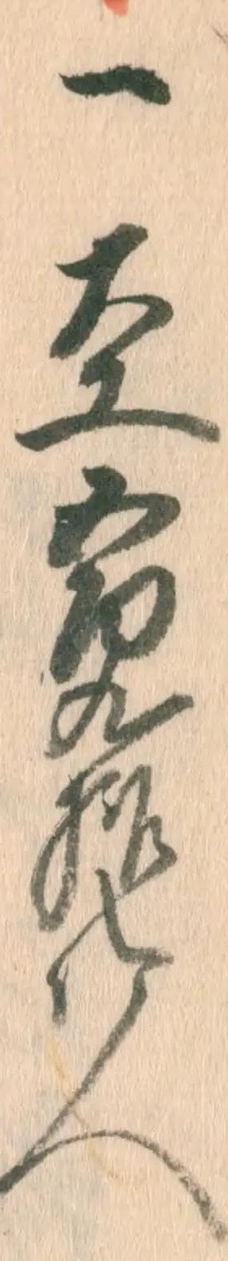一大工五百九拾八人
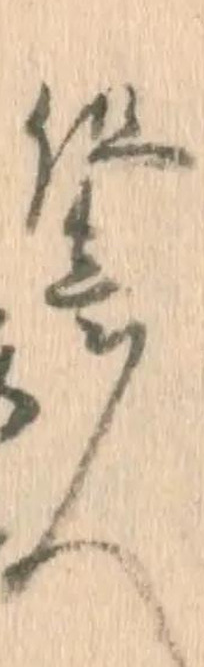但壱人
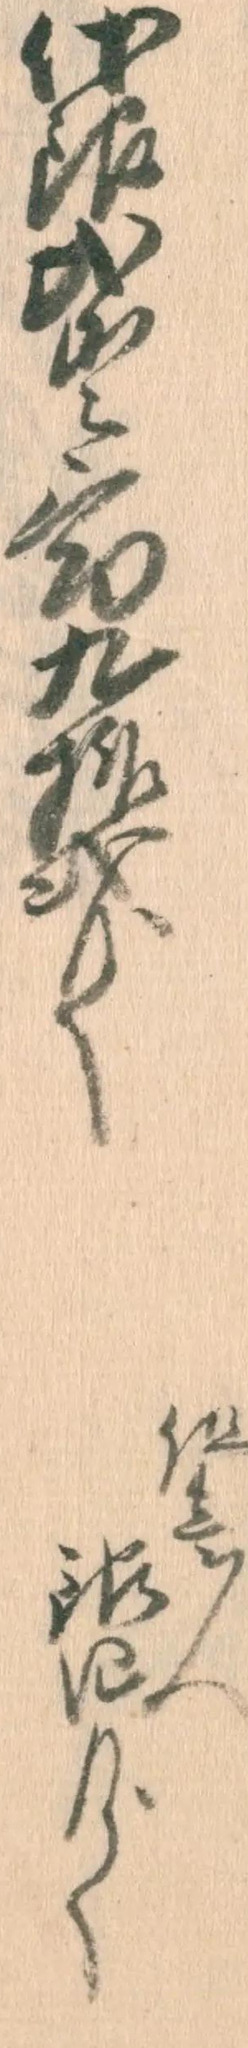代銀弐貫三百九拾弐匁銀四匁
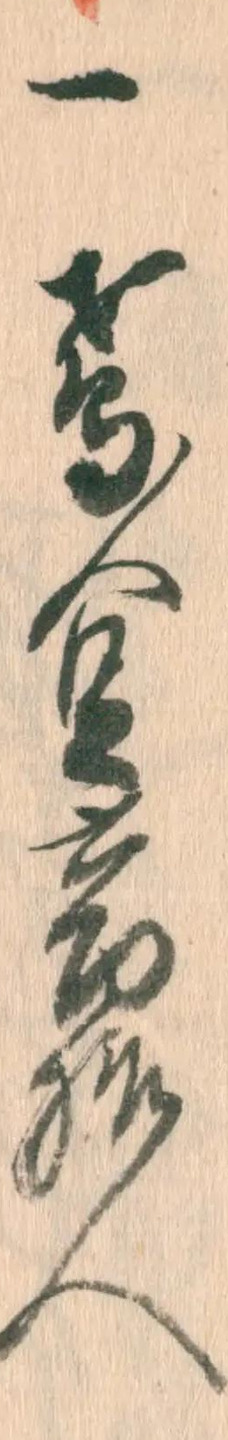一鳶人足六百拾人
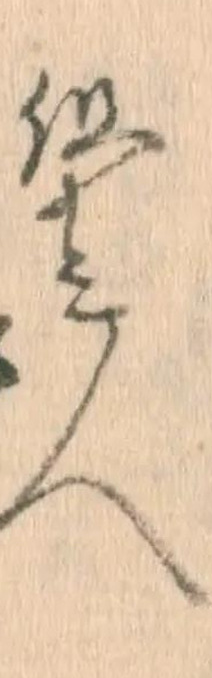但壱人
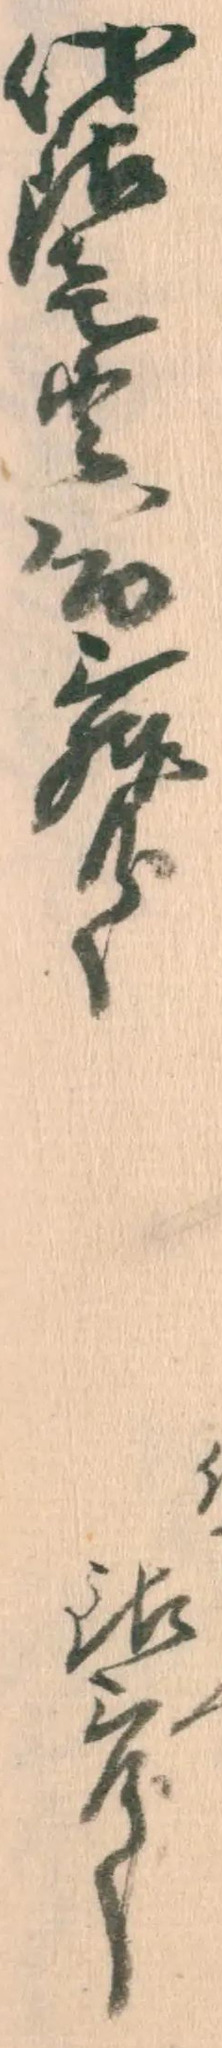代銀壱貫八百三拾匁銀三匁
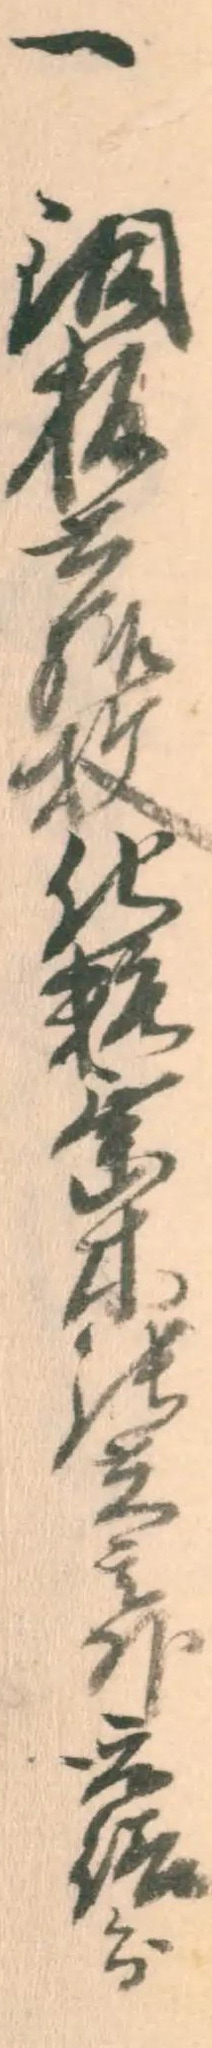一銅板六拾枚化粧垂木張立其外取繕分
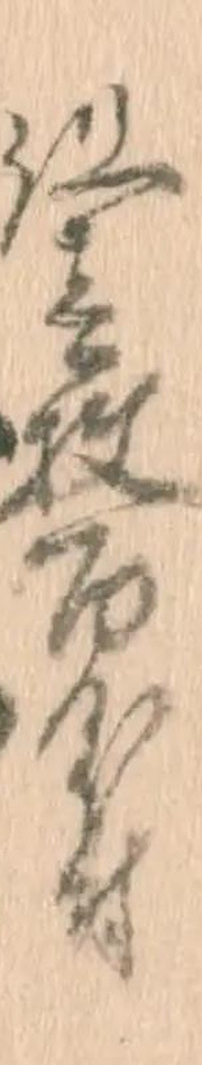但壱枚百匁付
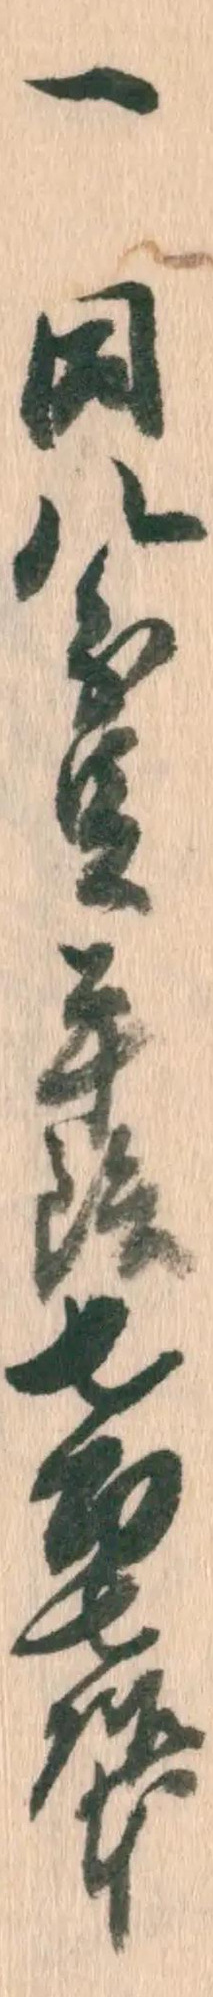一同八分足平鉄七百七拾本
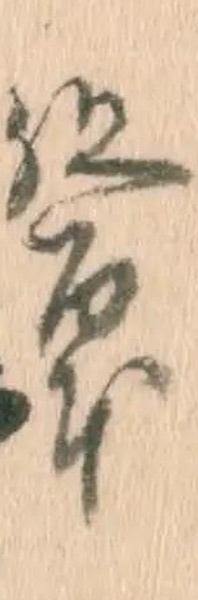但百本
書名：三十三間堂. [1]
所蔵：国立国会図書館 National Diet Library, JAPAN
